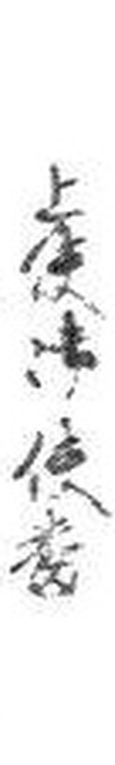上使御使番
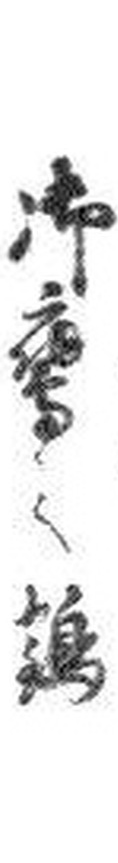御鷹之鶴
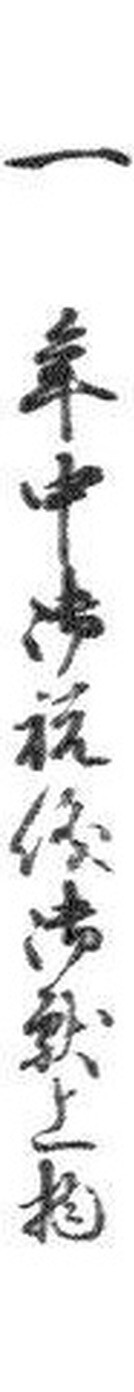一年中御祝儀御献上物
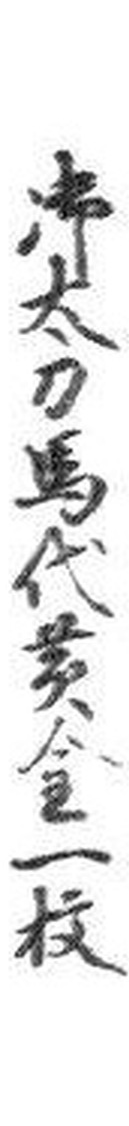年頭御太刀馬代黄金一枚
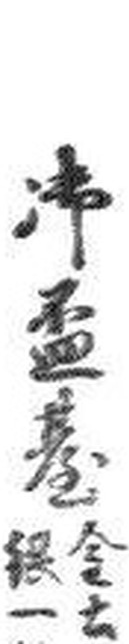御見台
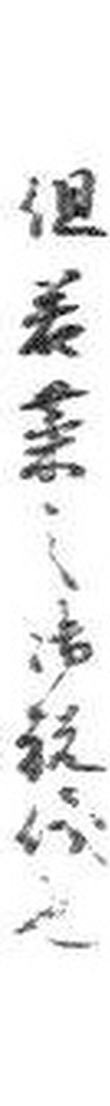但若菜之御祝儀也
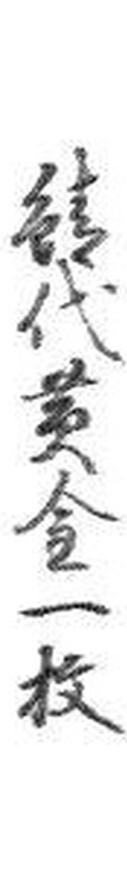七夕鯖代黄金一枚
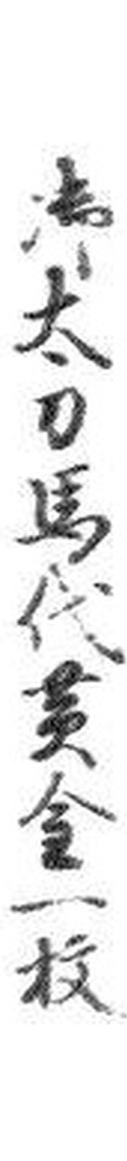年頭御太刀馬代黄金一枚

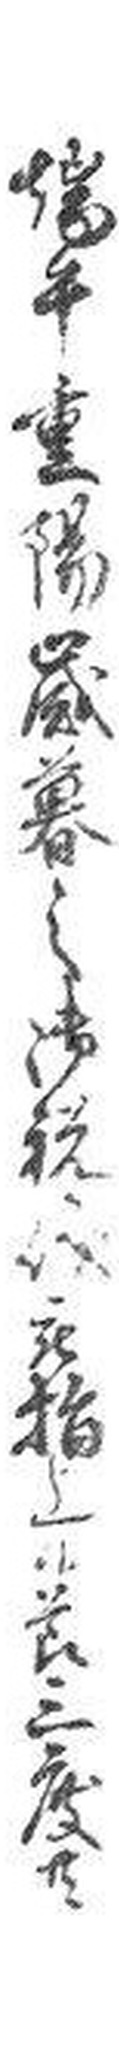端午重陽歳暮之御祝儀被指上候節三度共
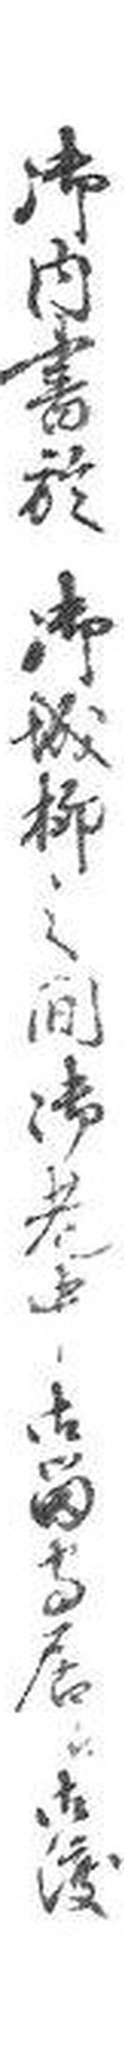御内書於御城柳之間御老中御留守居江御渡
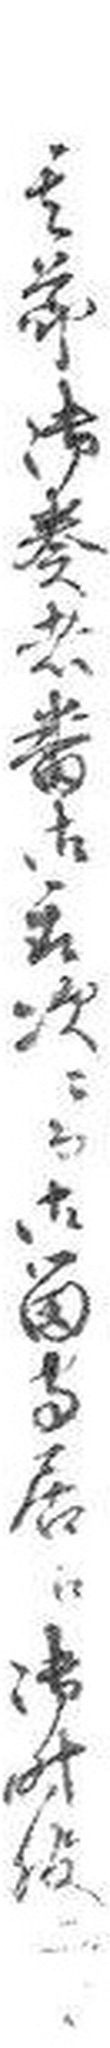其節御奏者番御取次ニ而御留守居江御時服二
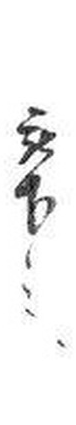被下之
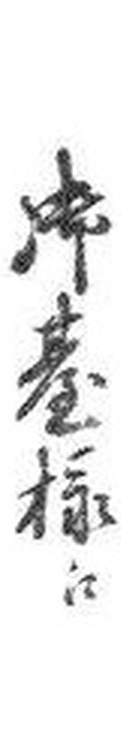御台様江
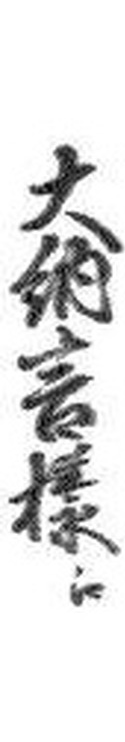大納言様江
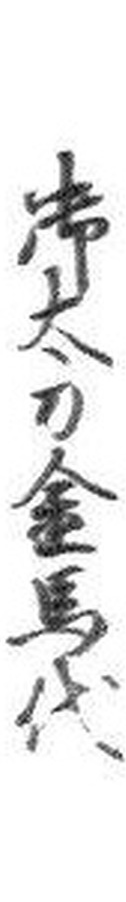年頭御太刀金馬代
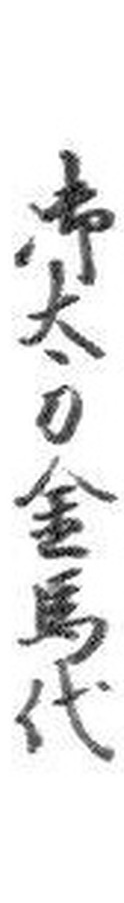年頭御太刀金馬代
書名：家譜 二十六 吉品公 従宝永七年到正徳二年
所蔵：福井県文書館 Fukui Prefectural Archives
